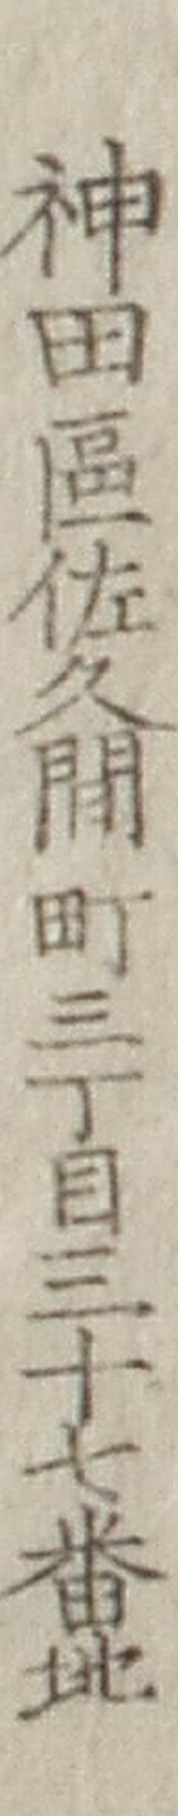神田区佐久間町三丁目三十七番地
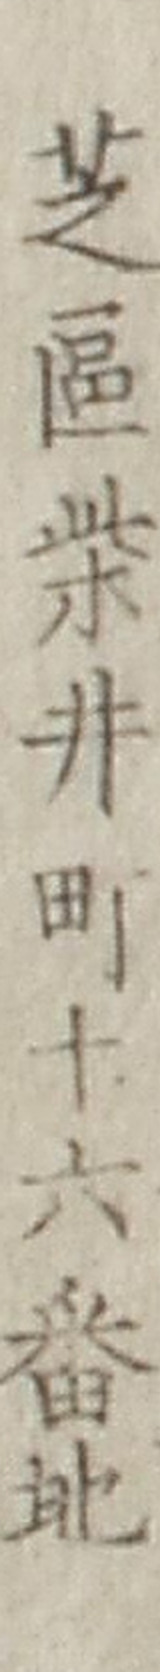芝区柴井町十六番地
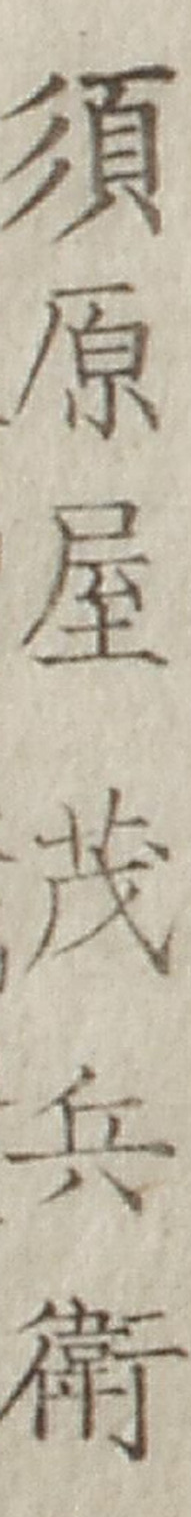全須原屋茂兵衛
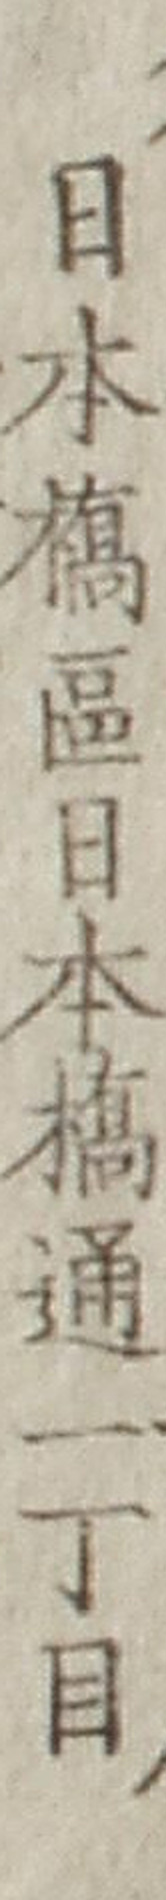日本橋区日本橋通一丁目
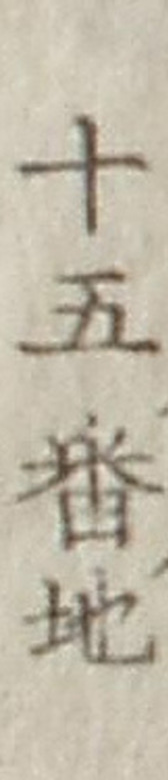十五番地
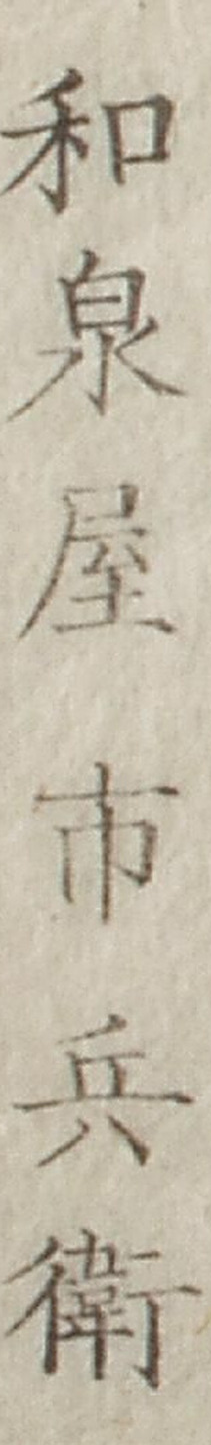全和泉屋市兵衛
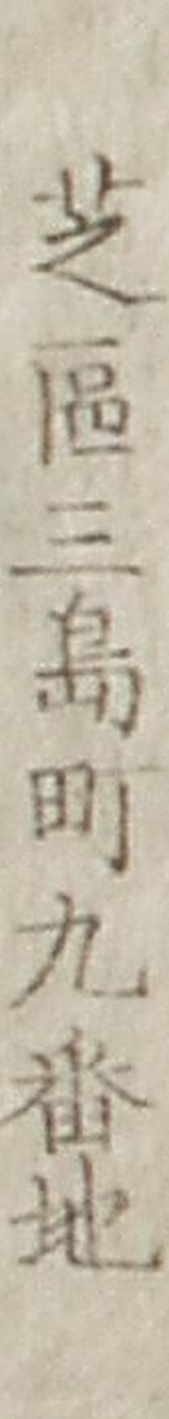芝区三島町九番地
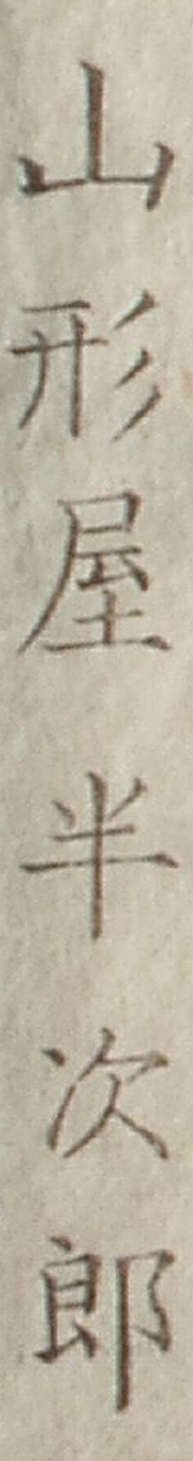全山形屋半次郎
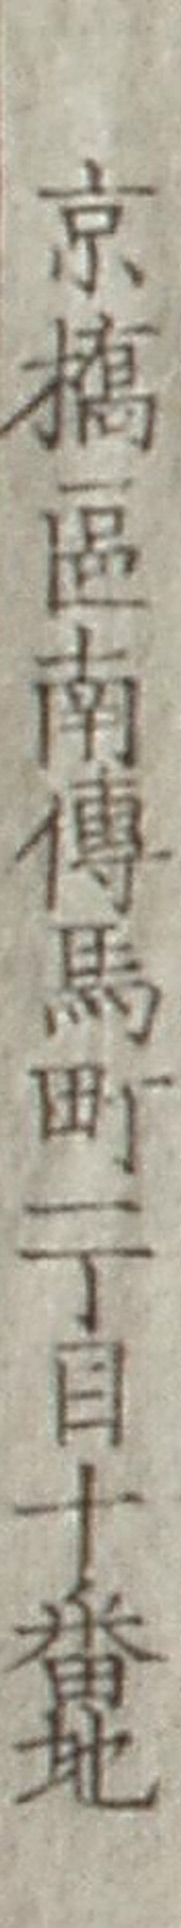京橋区南伝馬町一丁目十番地
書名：地形論　巻二
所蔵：東京大学地震研究所図書室 Earthquake Research Institute Library, The University of Tokyo, JAPAN
